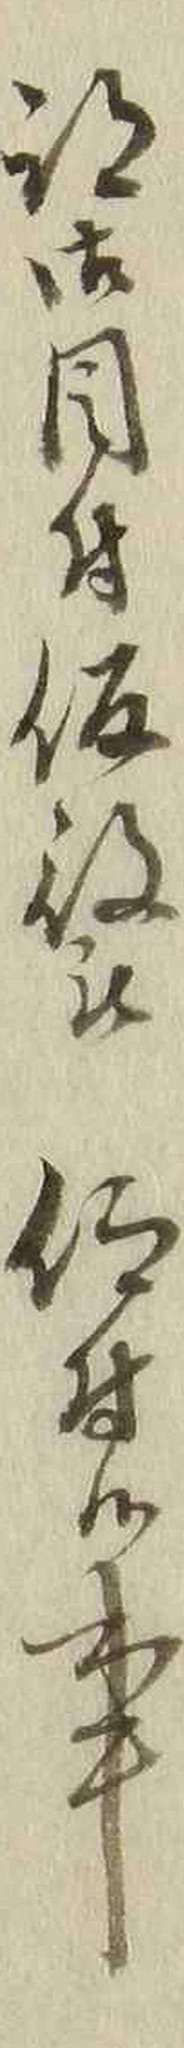跡御目付仮役被仰付候事
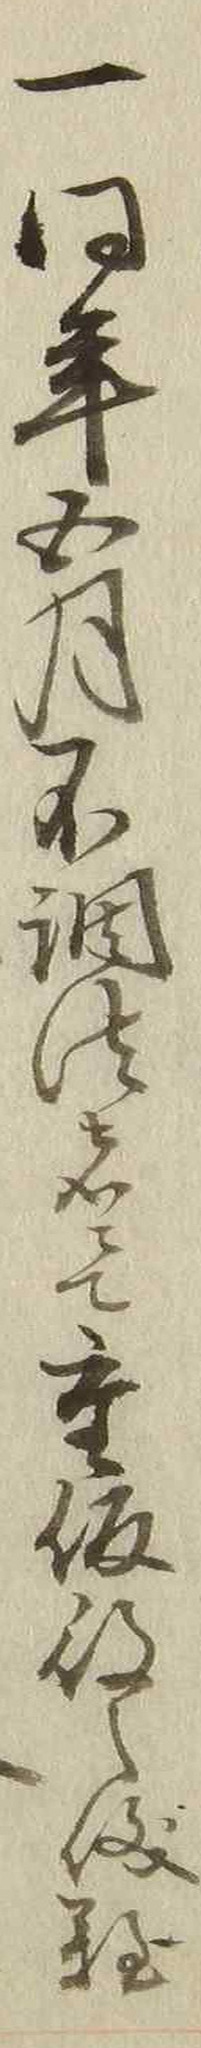一同年五月不調法者ニて重仮役之儀難
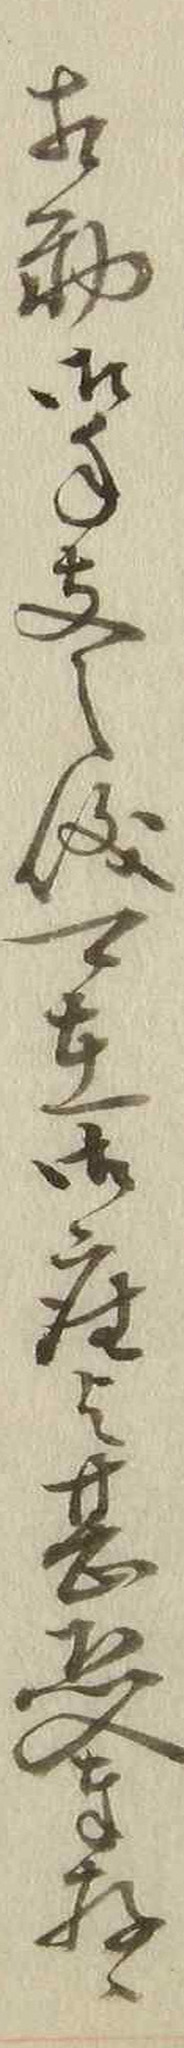相勤御手支之儀可在御座与甚恐入奉存候
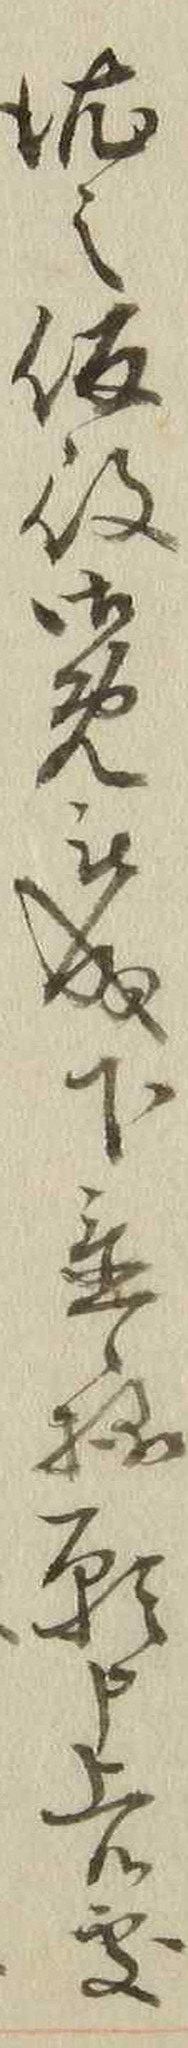依之仮役御免被成下置候様願申上候処
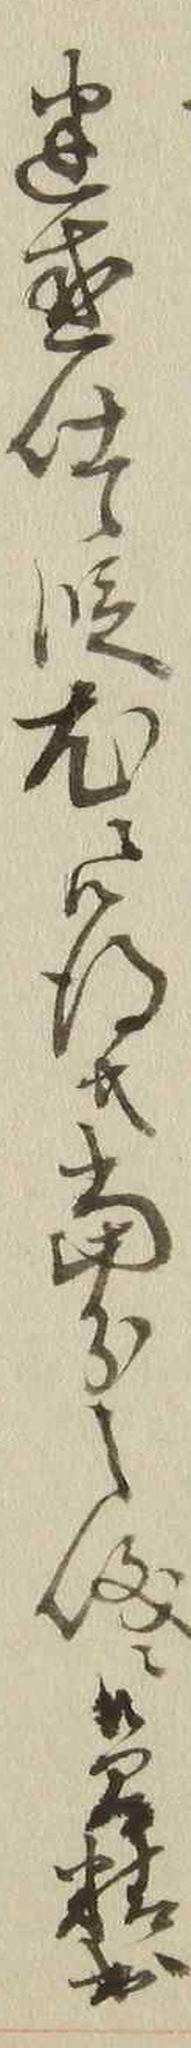迷惑仕候段尤ニ候得共当分之儀ニ候間精出
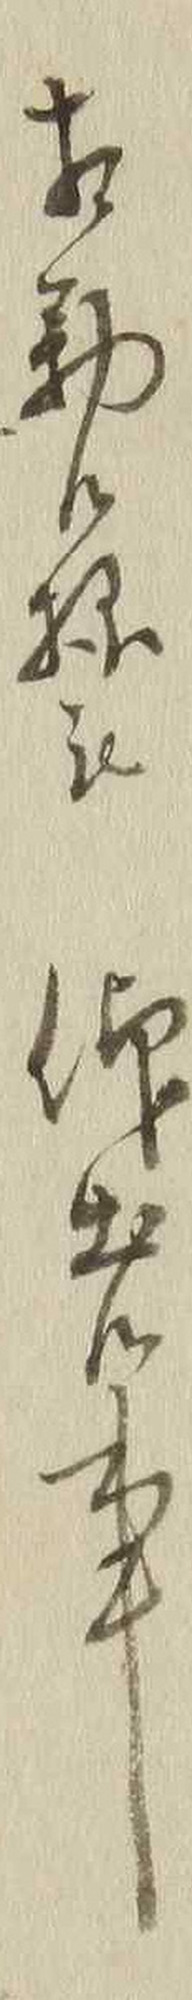相勤候様被仰出候事
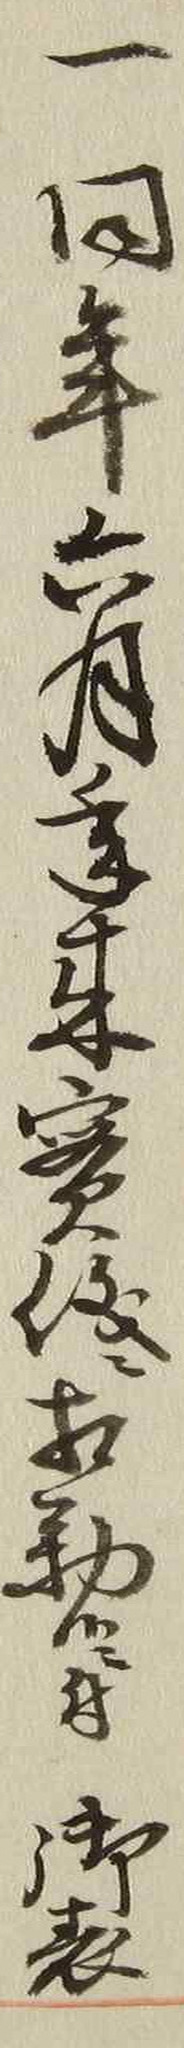一同年六月年来実儀ニ相勤候ニ付御表
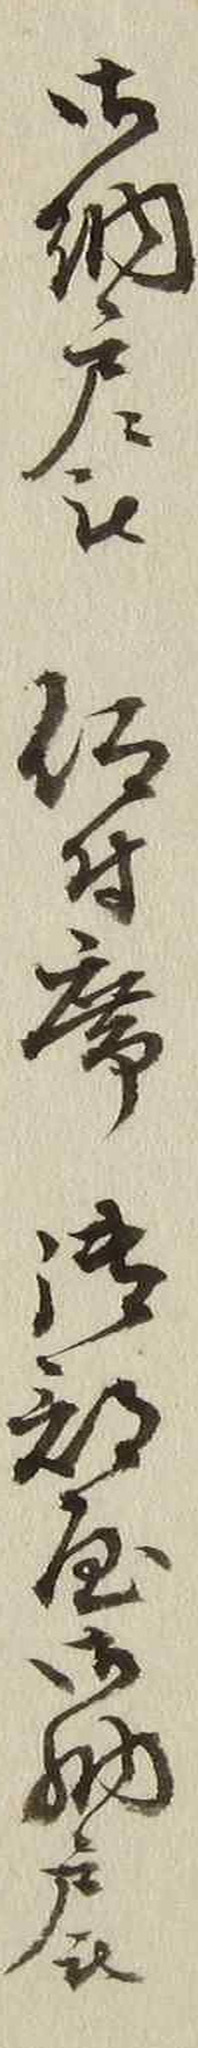御納戸ニ被仰付席御部屋御納戸被
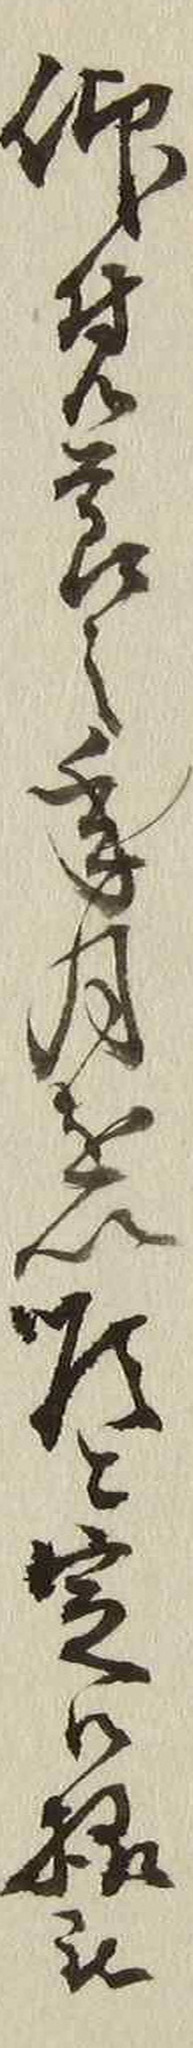仰付候節之年月を以順と定候様被
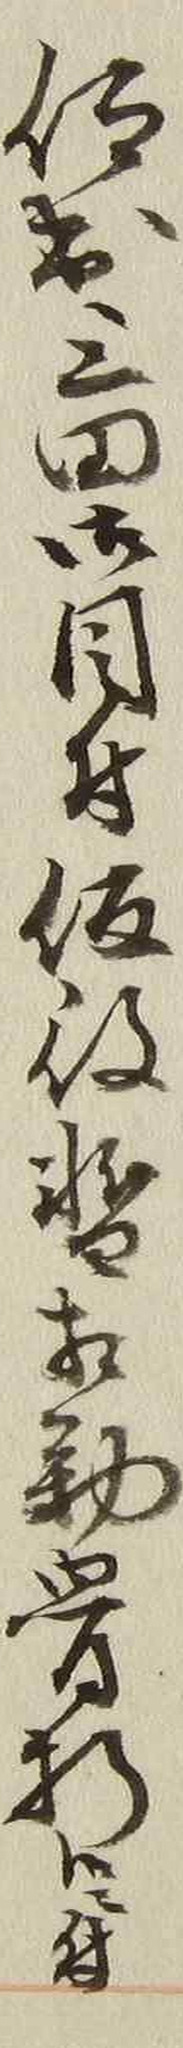仰出三田御目付仮役暫相勤骨折候ニ付
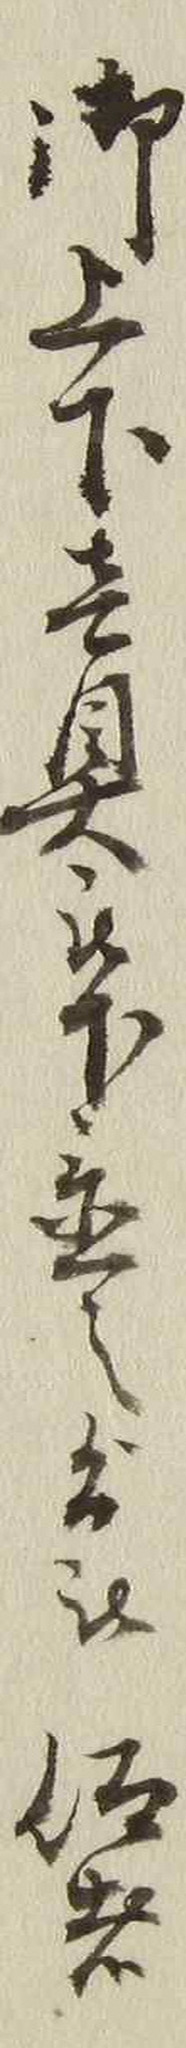御上下壱具被下置之旨被仰出候
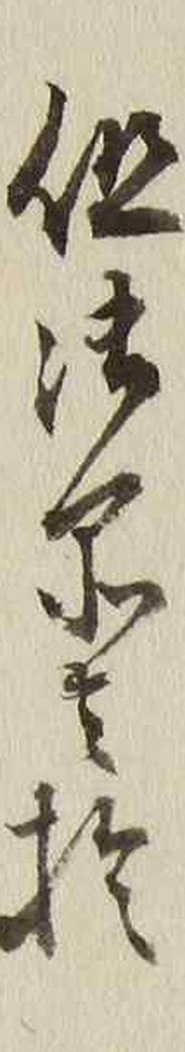但御品者於
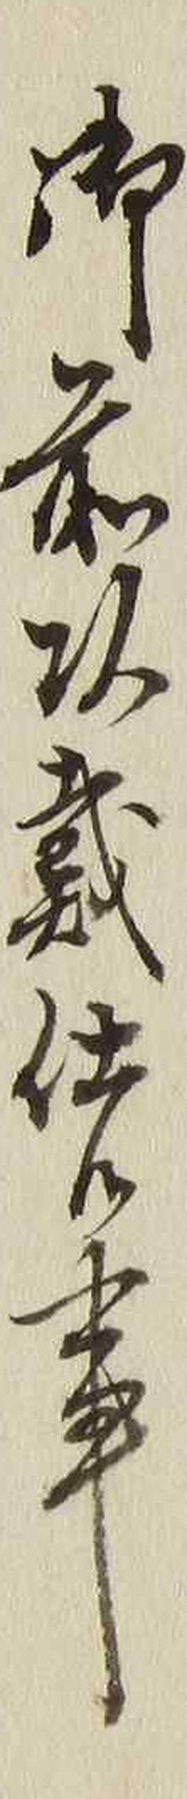御前頂戴仕候事
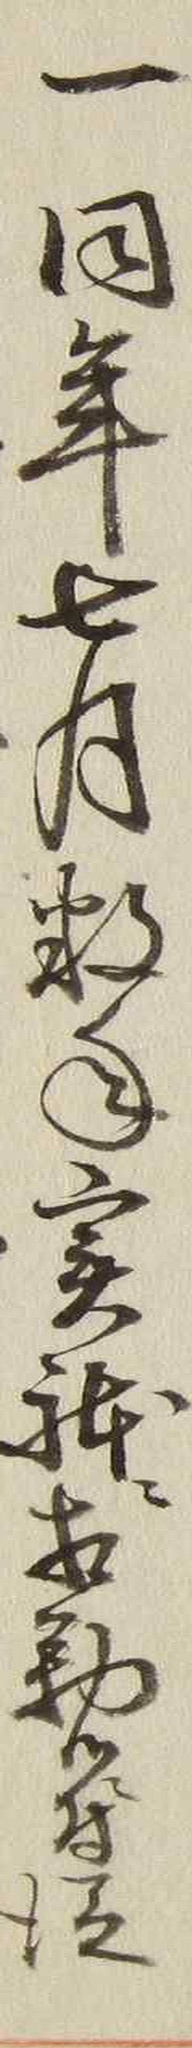一同年七月数年実体ニ相勤候ニ付従
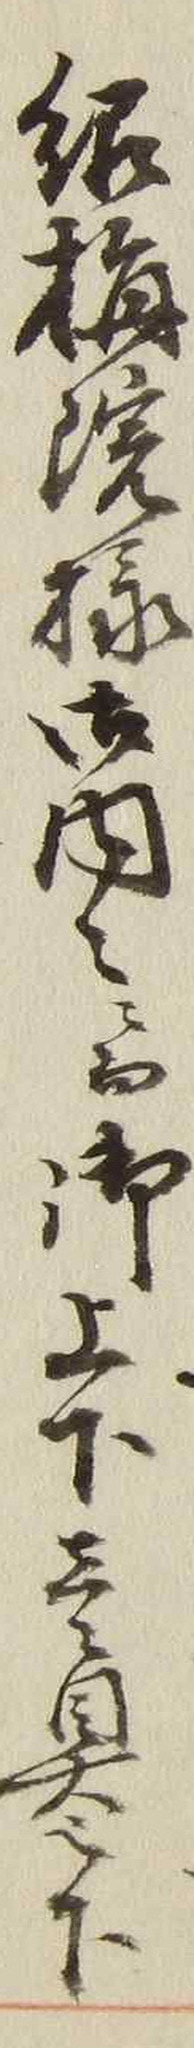紹栴院様御内々ニ而御上下壱具被下
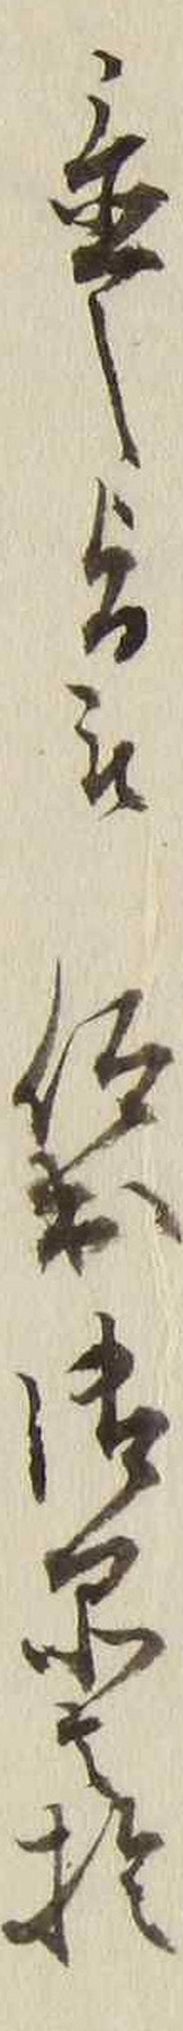置之旨被仰出御品者於
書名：諸士系譜　巻之23　い之部23
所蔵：会津若松市立会津図書館
